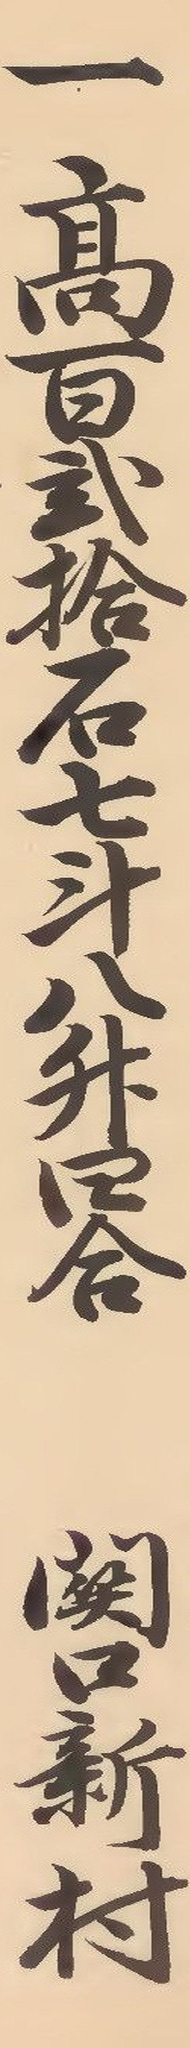一高百弐拾石七斗八升四合関口新村
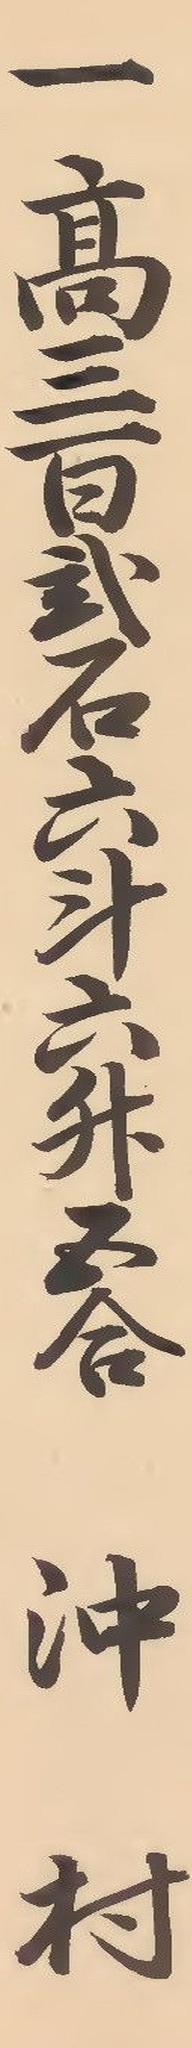一高三百弐石六斗六升五合沖村
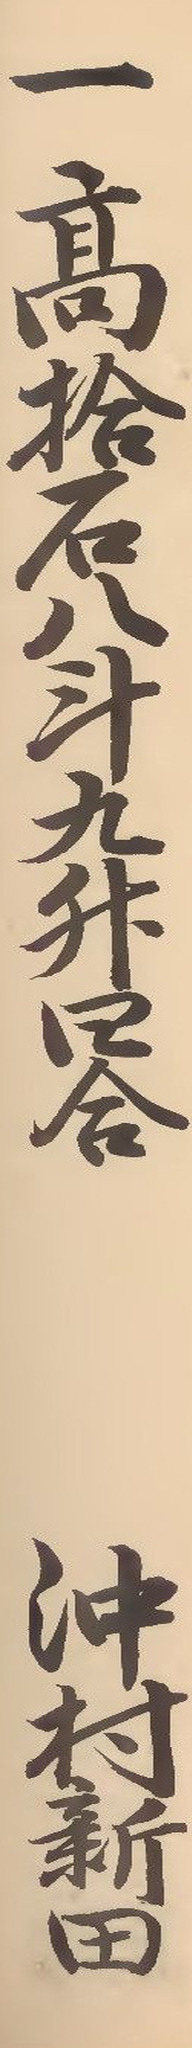一高拾石八斗九升四合沖村新田
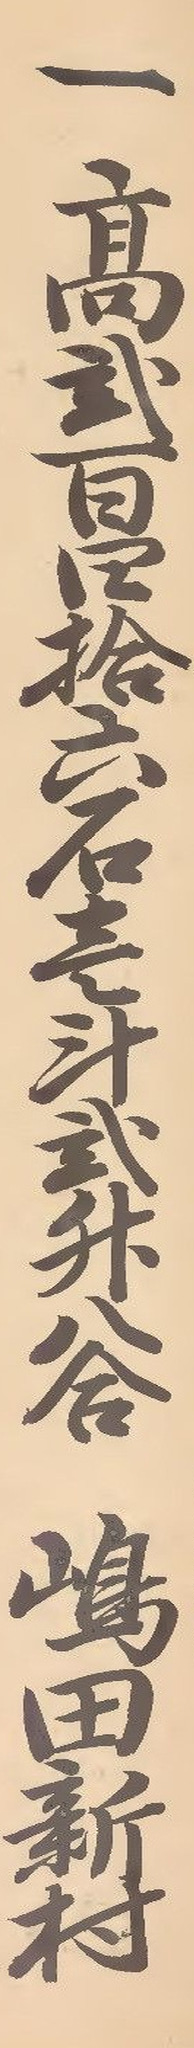一高弐百四拾六石壱斗弐升八合島田新村
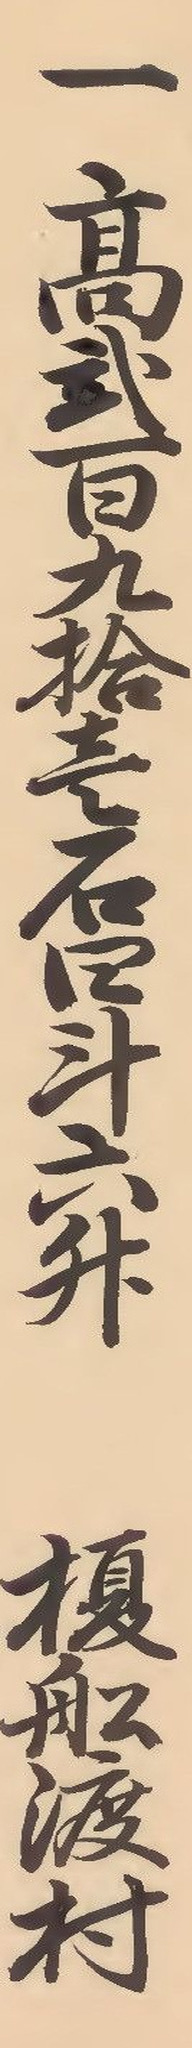一高弐百九拾壱石四斗六升榎船渡村
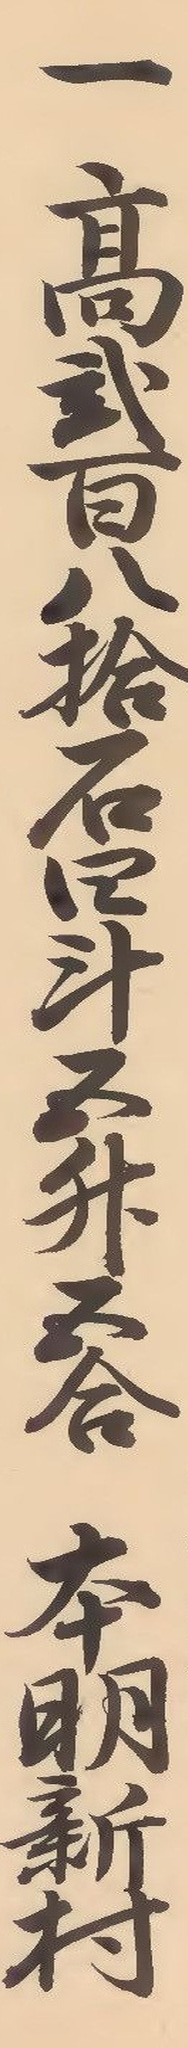一高弐百八拾石四斗五升五合本明新村
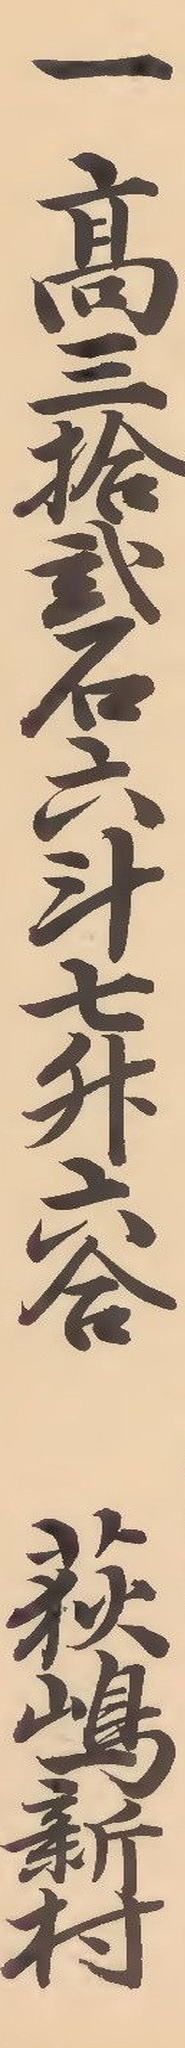一高三拾弐石六斗七升六合荻島新村

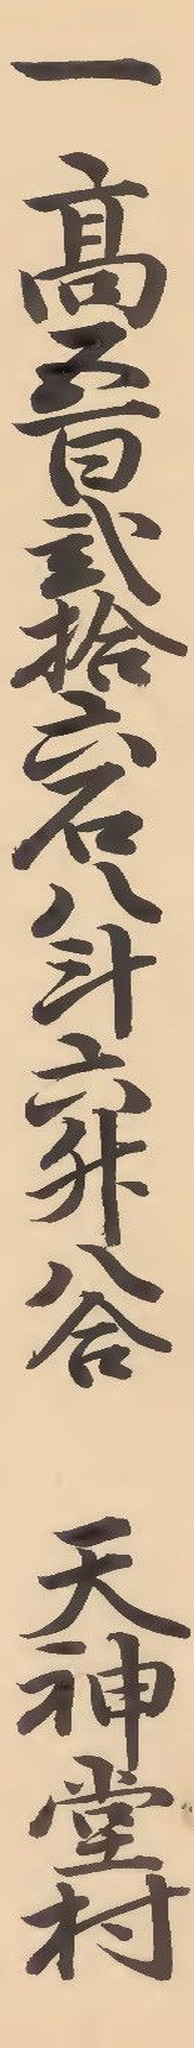一高五百弐拾六石八斗六升八合天神堂村
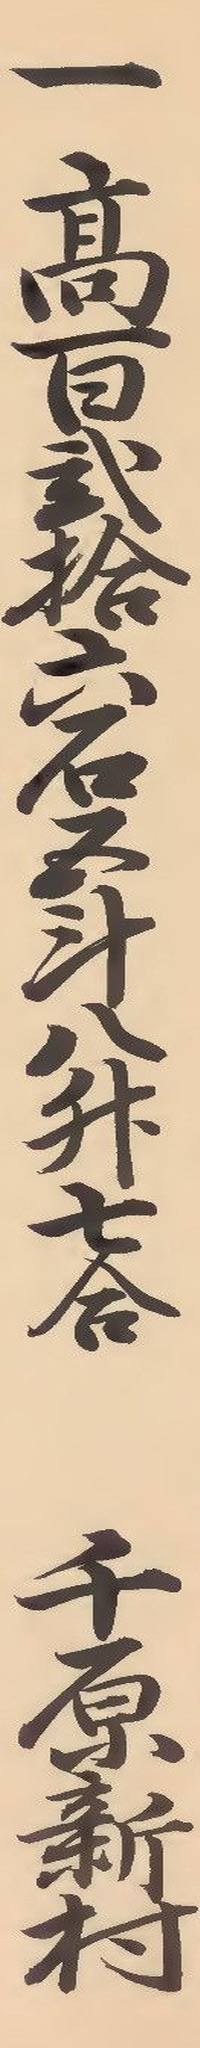一高百弐拾六石五斗八升七合千原新村
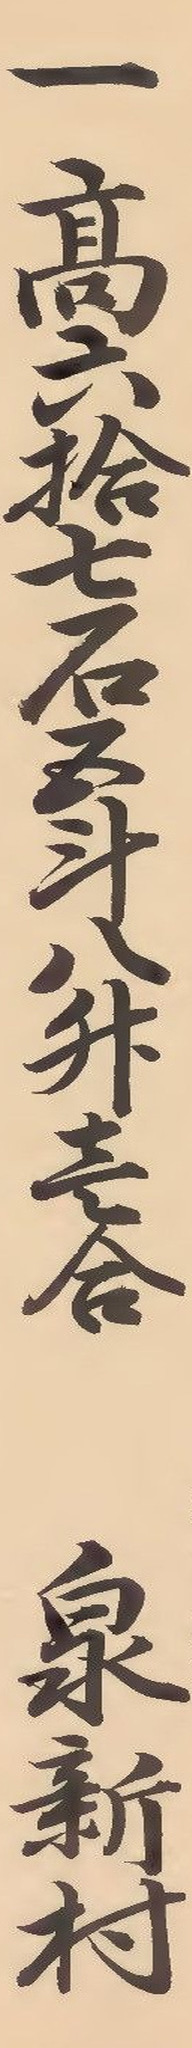一高六拾七石五斗八升壱合泉新村
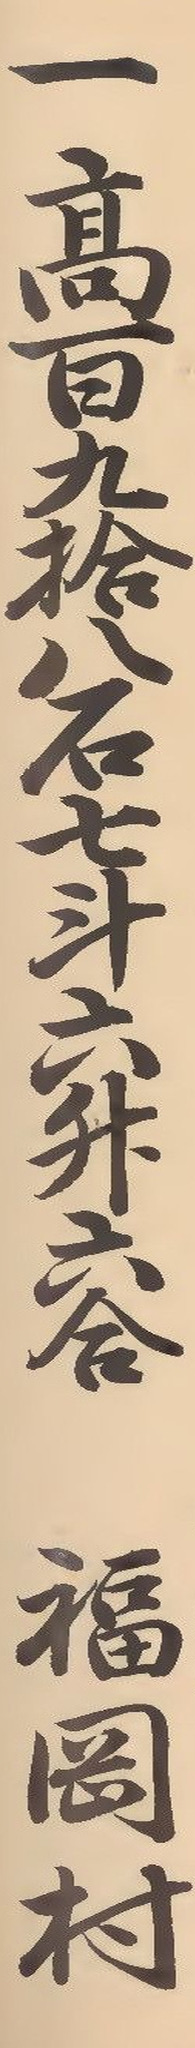一高百九拾八石七斗六升六合福岡村
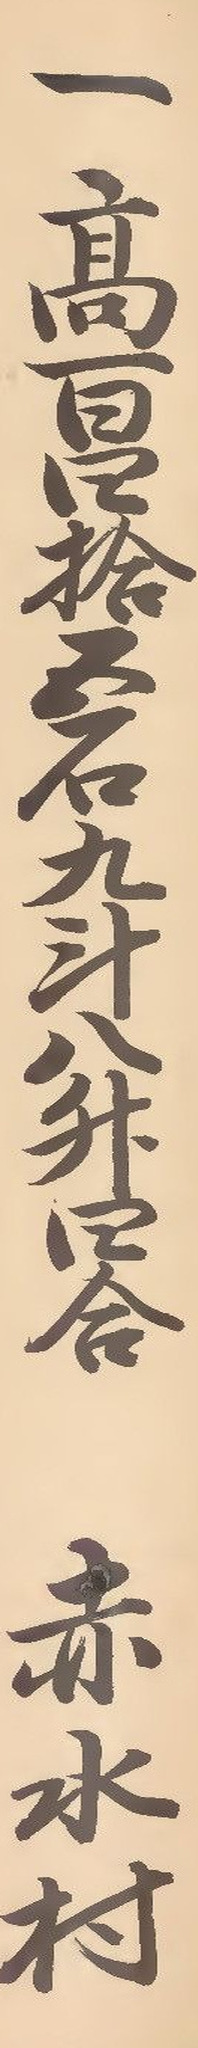一高百四拾五石九斗八升四合赤水村
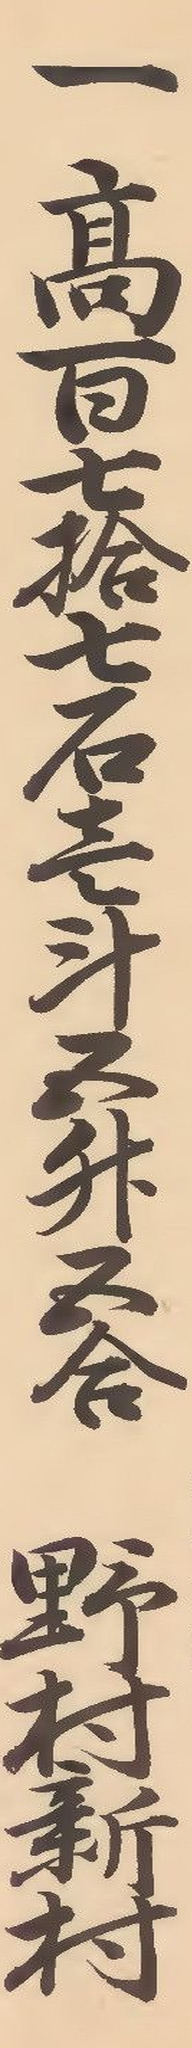一高百七拾七石壱斗五升五合野村新村
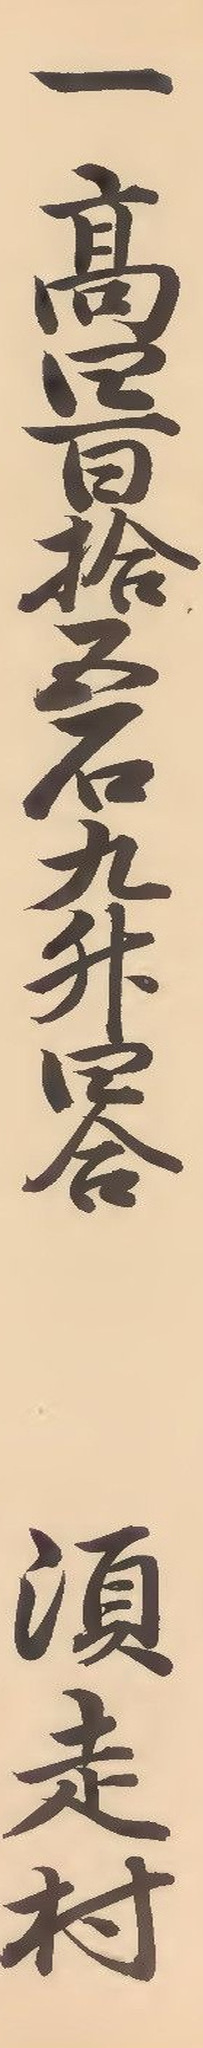一高四百拾五石九升四合須走村
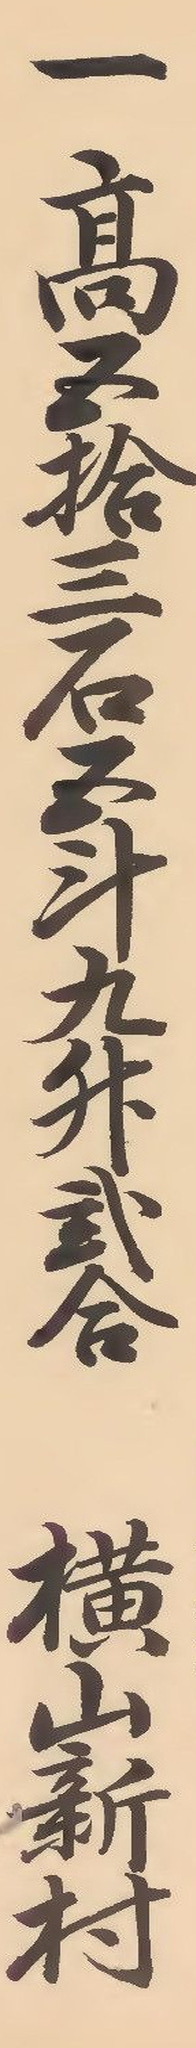一高五拾三石五斗九升弐合横山新村

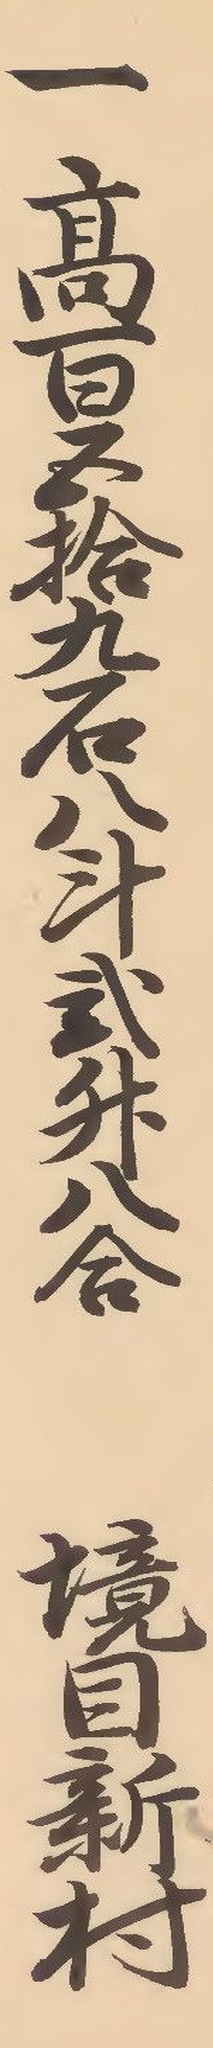一高百五拾九石八斗弐升八合境目新村
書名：越後国郷帳　下
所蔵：国立公文書館 National Archives of Japan
